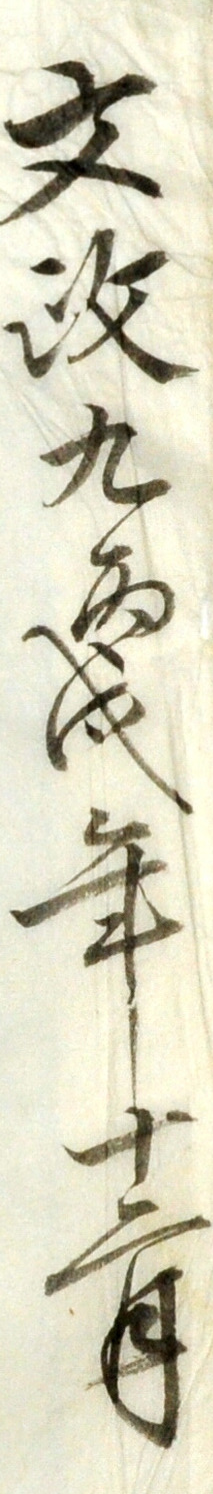文政九丙戌年十二月
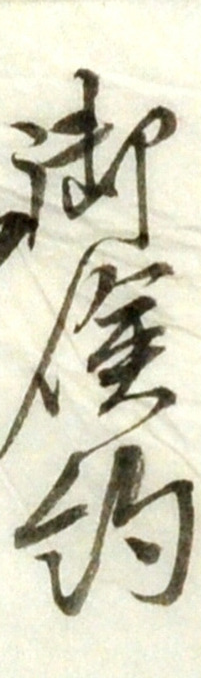御倹約
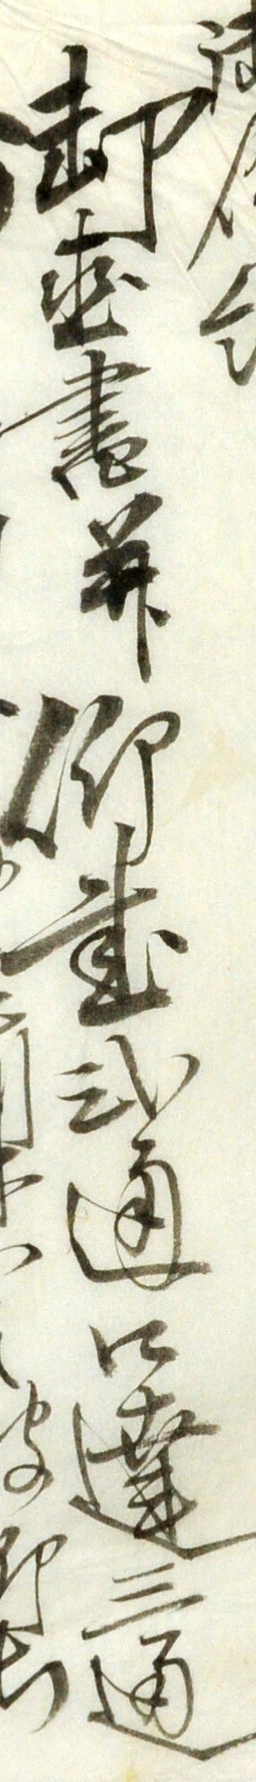御直書并仰書弐通、口達三通
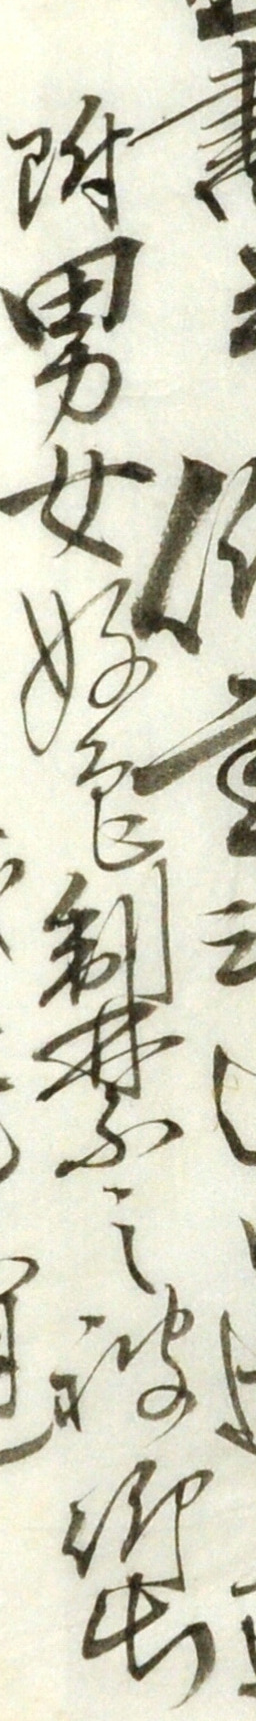附男女好色制禁之被仰出
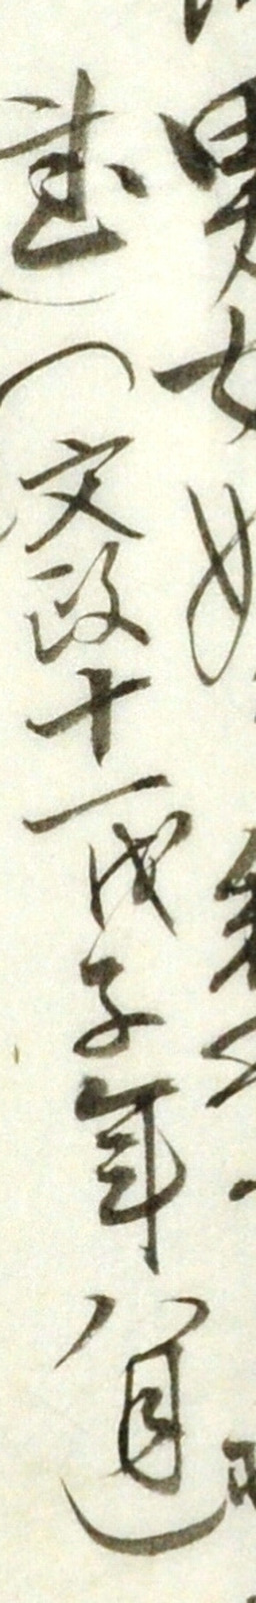書(文政十一戊子年八月)

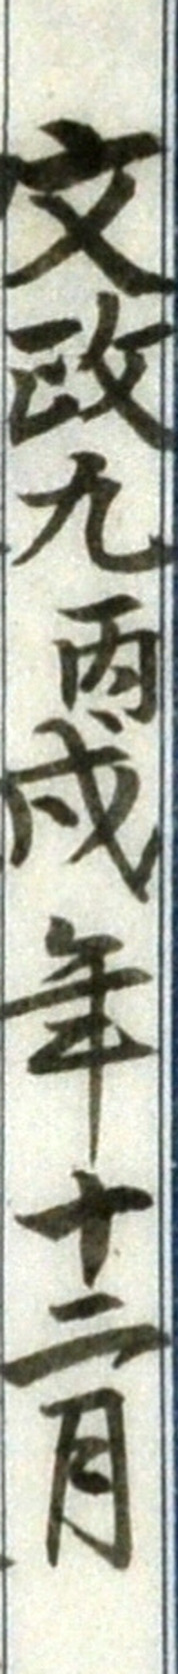文政九丙戌年十二月
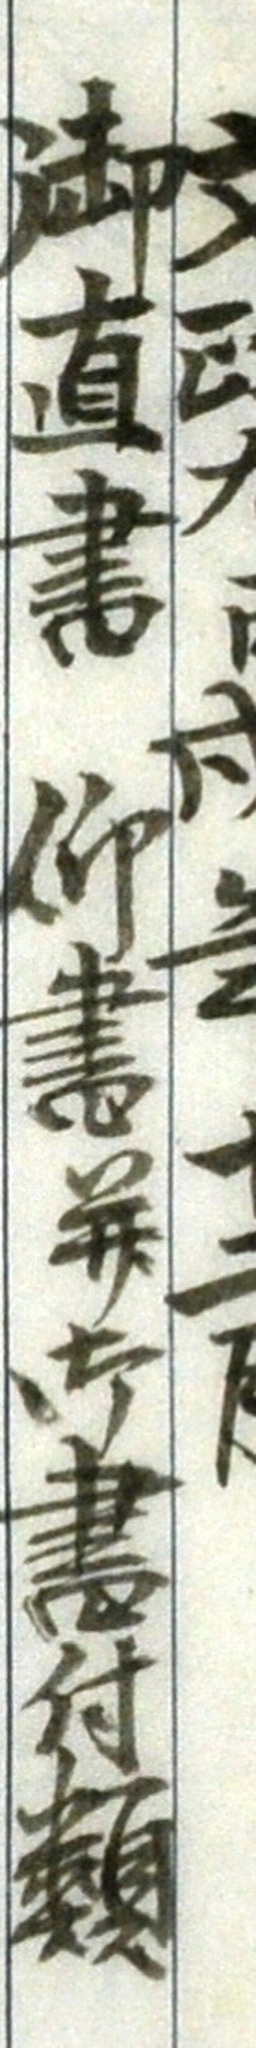御直書仰書并御書付類
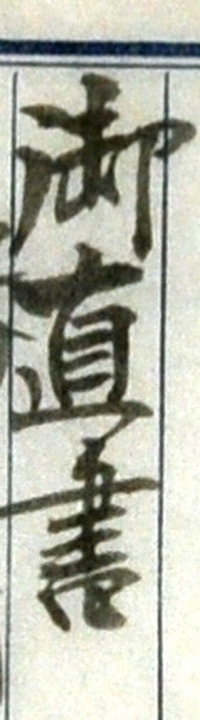御直書
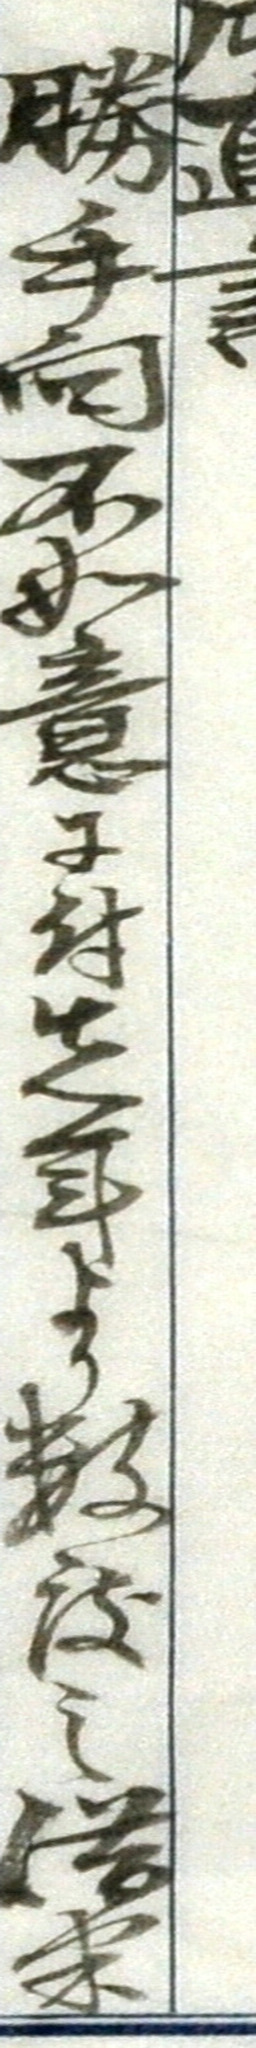勝手向不如意に付先年より数度之借米
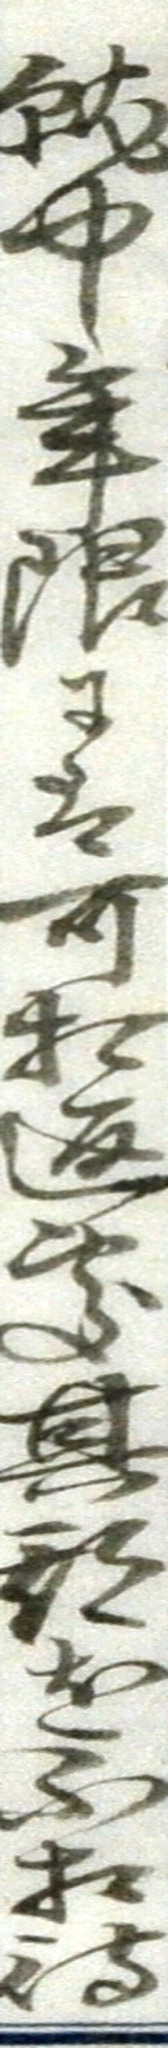就中年限には可相返処其斯を不相待
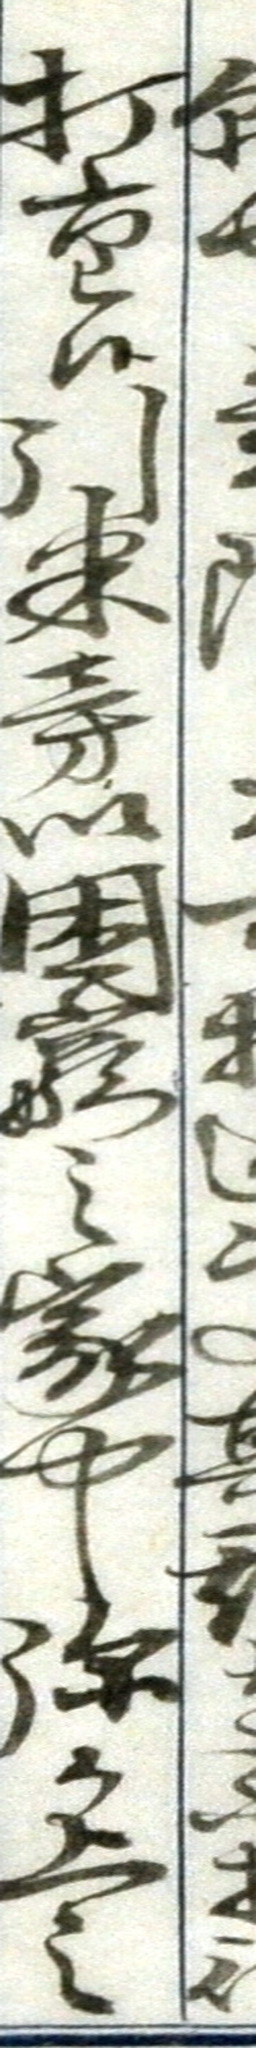打重候引米旁以困窮之家中深ク上之
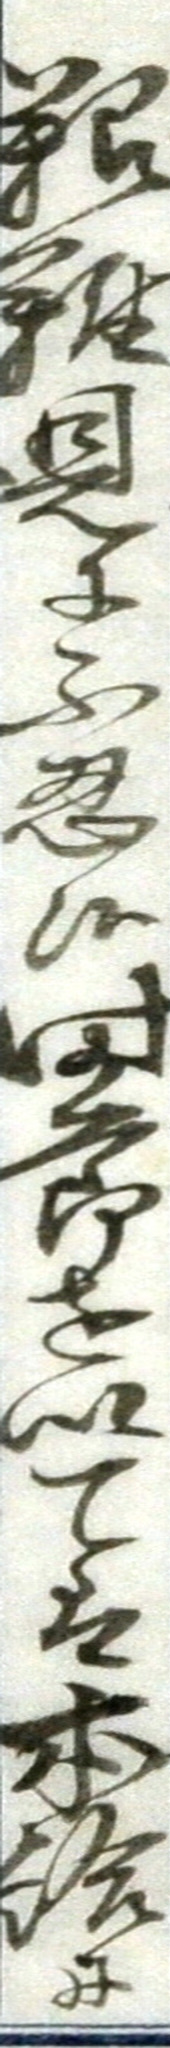艱難見に不忍候時節を以ては本給に
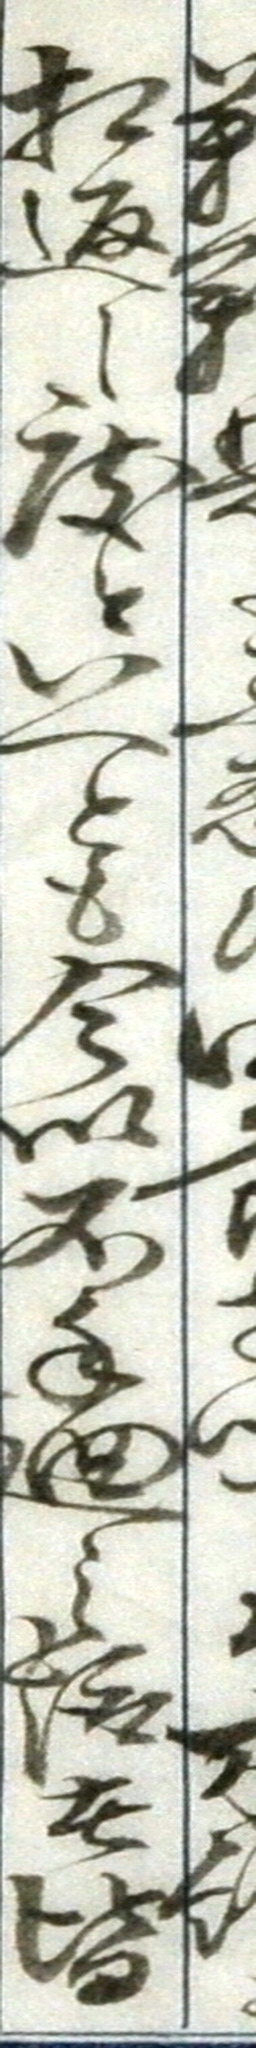相返し度といへとも今以不手廻之趣は皆
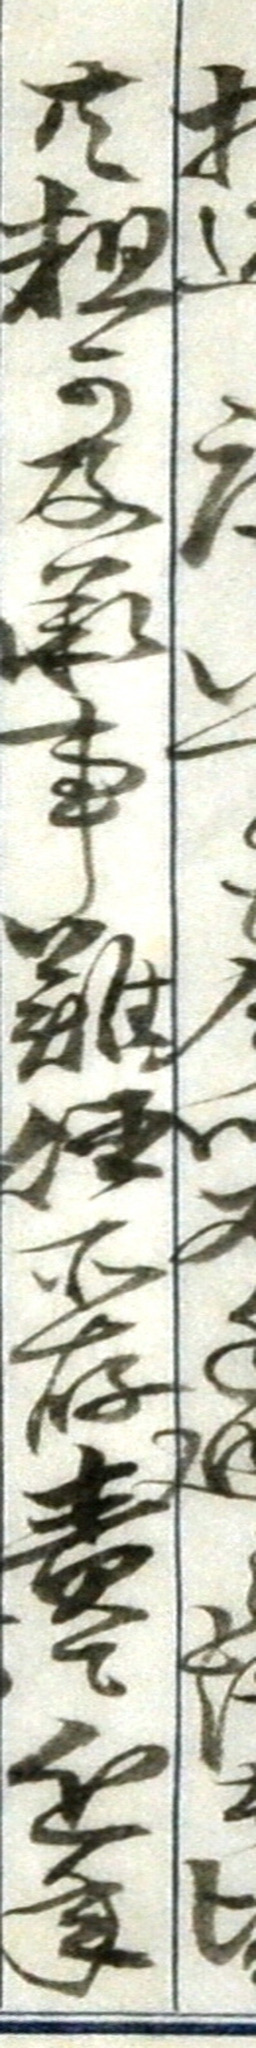共粗可及承事難便所存責て近年
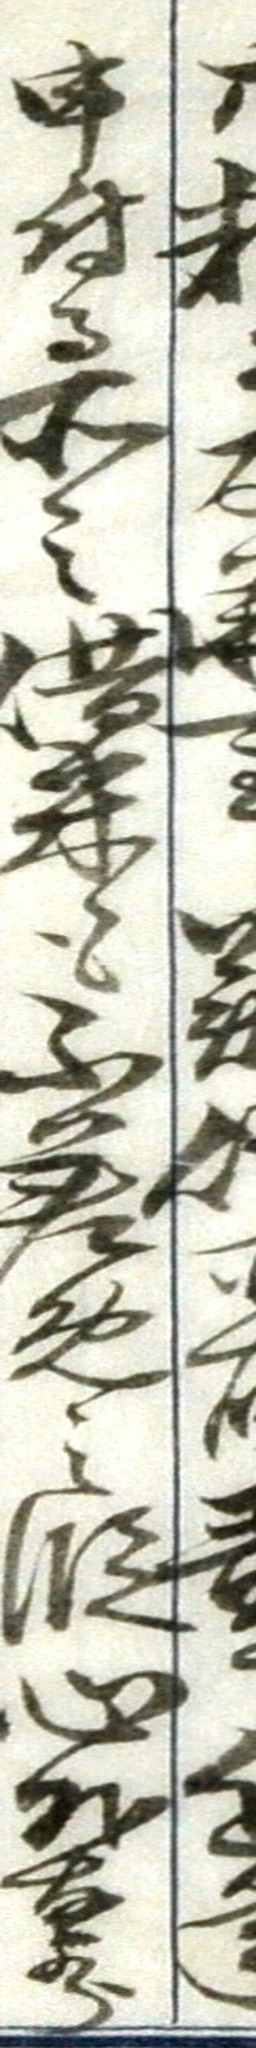申付る所之借米も不差免之段心外なから
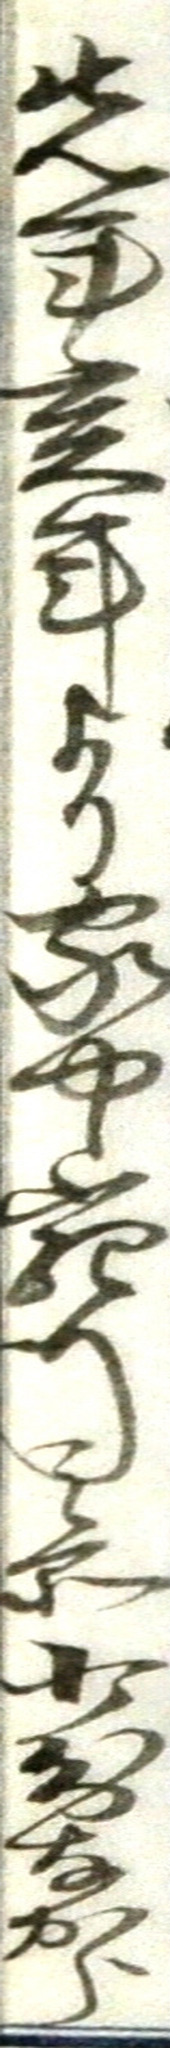先年亥年より家中宛行之所少分なから
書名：御倹約御直書并仰書
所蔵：伊那市立高遠町図書館・合同会社AMANE
